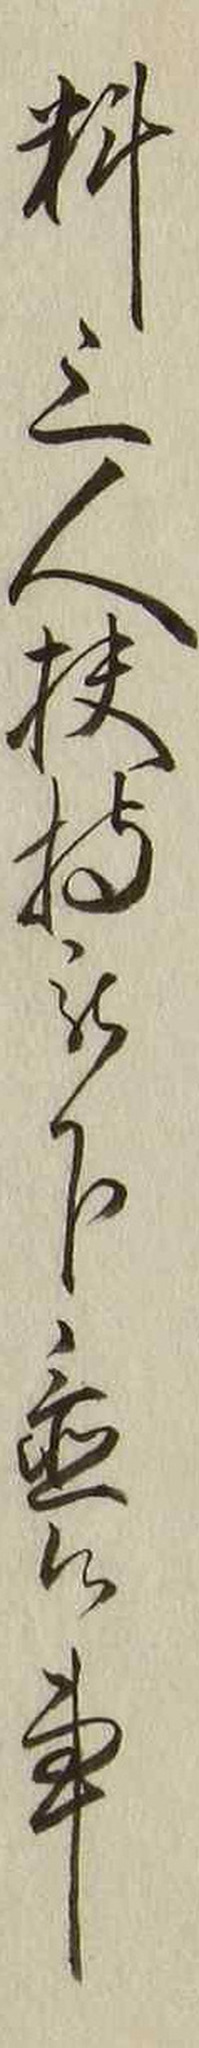料三人扶持被下置候事
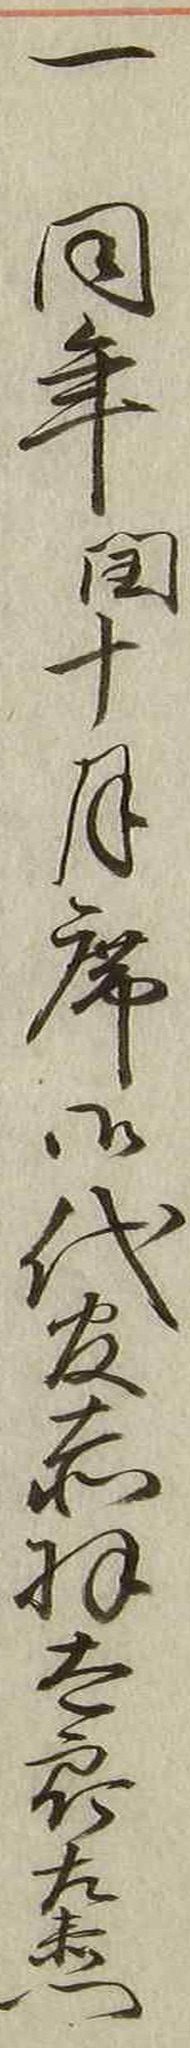一同年閏十月席御代官赤羽太郎左衛門
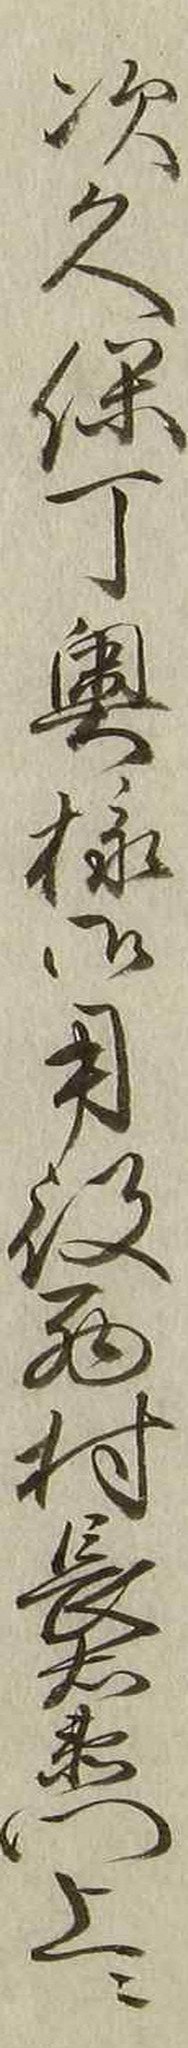次久保丁奥様御用役西村長右衛門上ニ
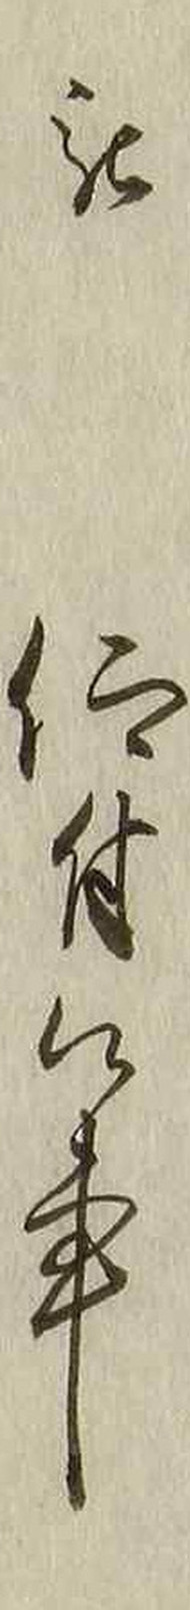被仰付候事
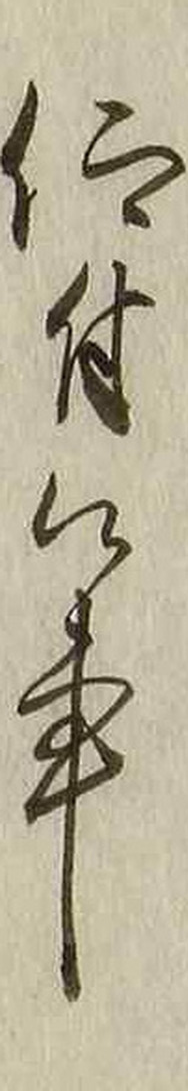仰付候事
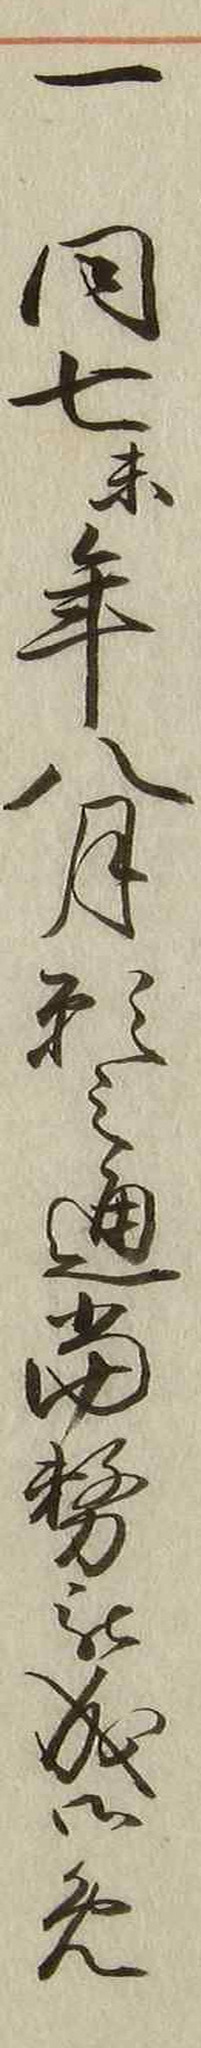一同七未年八月願之通当務被成御免
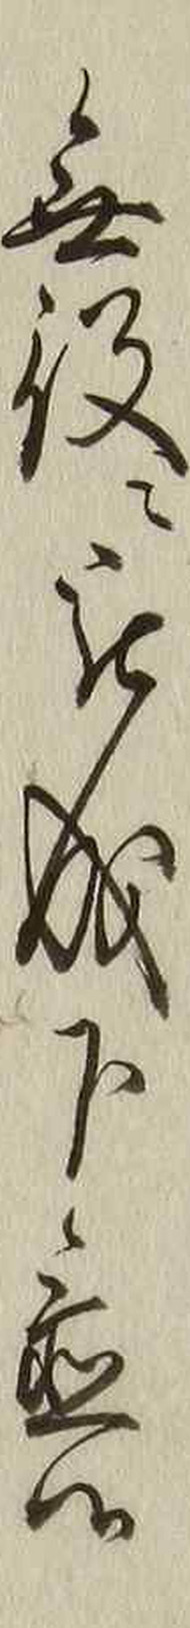無役ニ被成下置候
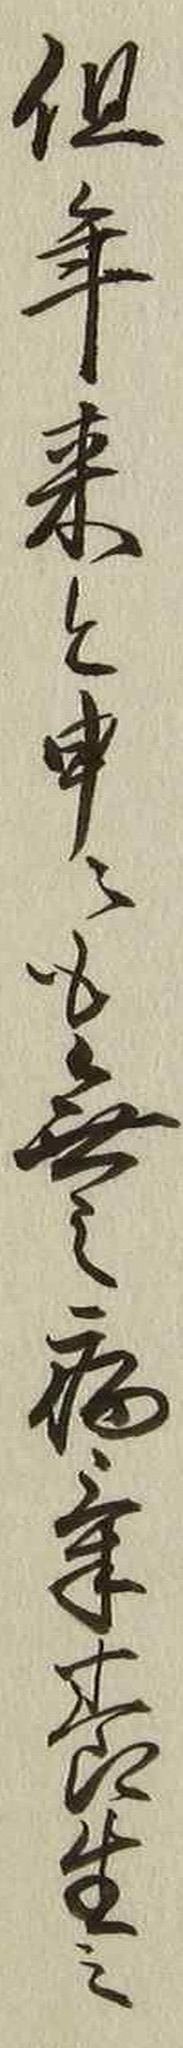但年来と申ニも無之病気養生之
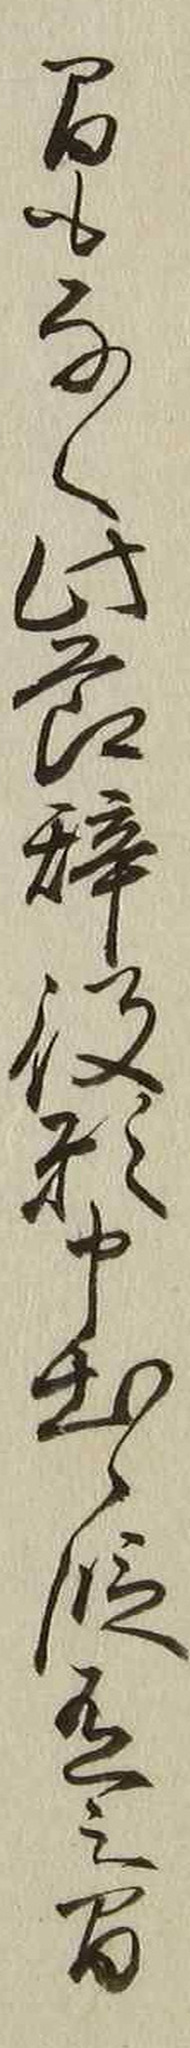間もなく此節辞役形申出候段有之間
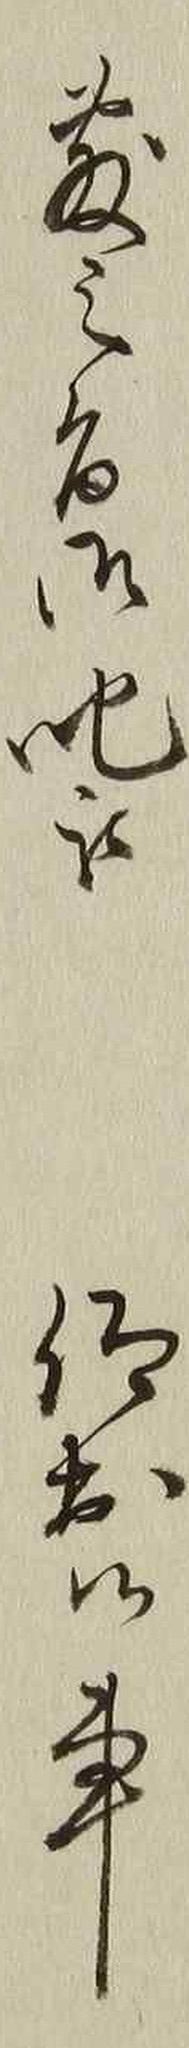敷之旨御叱被仰出候事
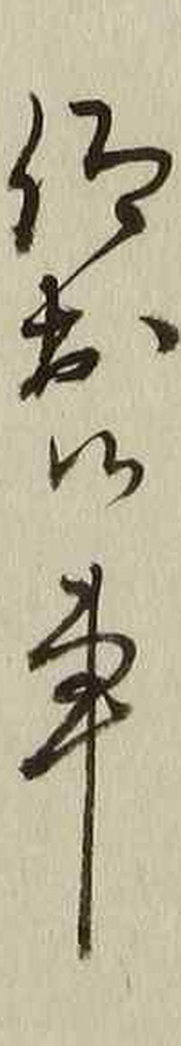仰付候事
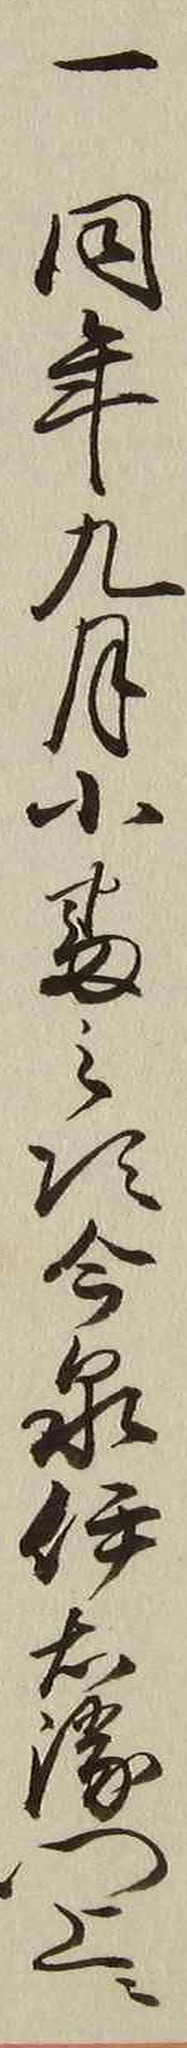一同年九月小番之次今泉伊右衛門上ニ
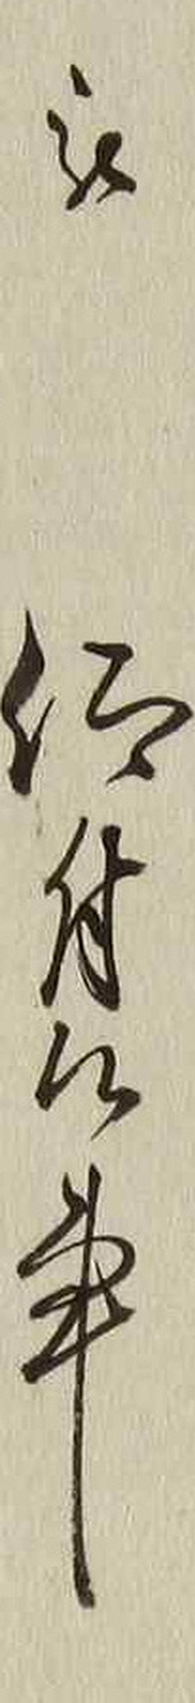被仰付候事
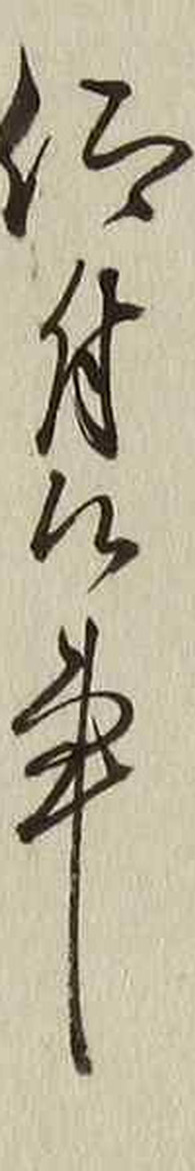仰付候事
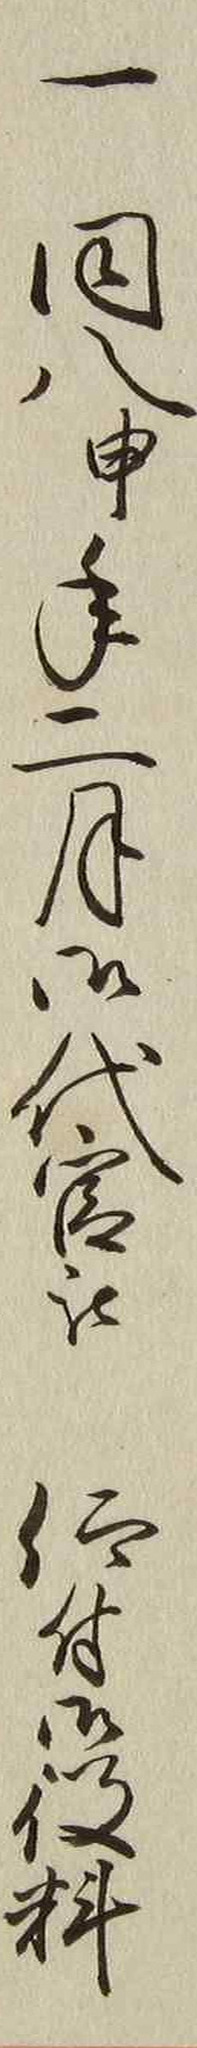一同八申年二月御代官被仰付御役料
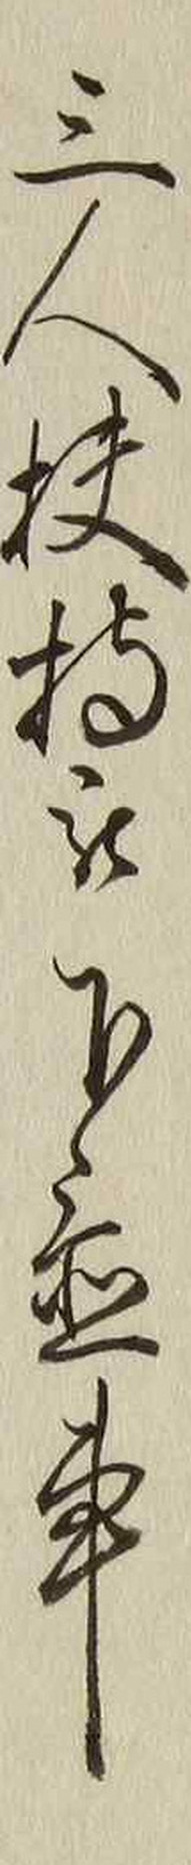三人扶持被下置事
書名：諸士系譜　巻之21　い之部21
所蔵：会津若松市立会津図書館
